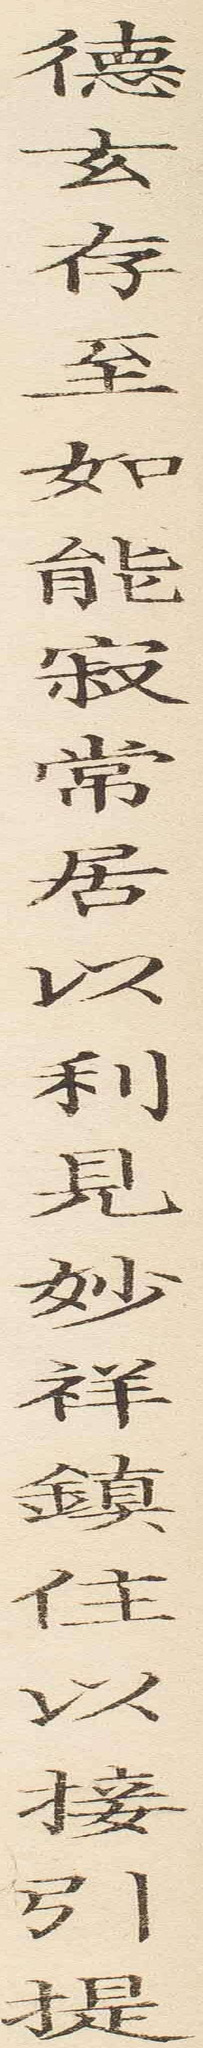德玄存至如能寂常居以利見妙祥鎮住以接引提
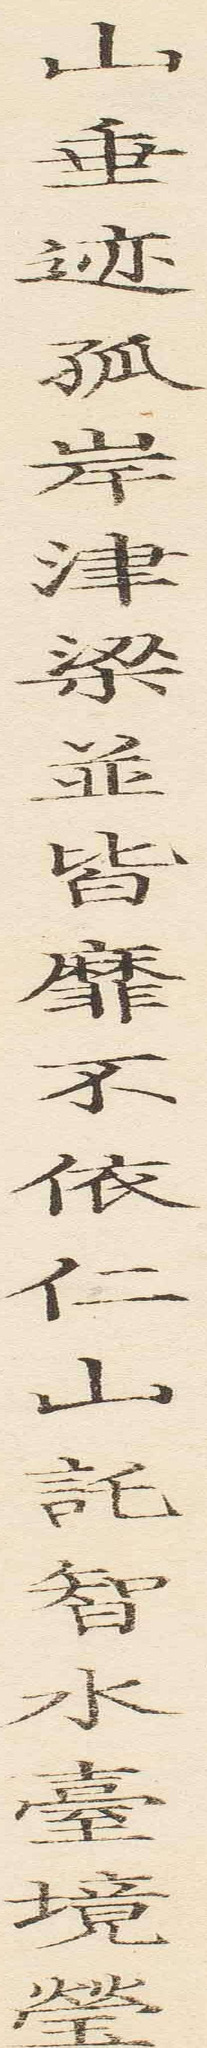山垂迹孤岸津梁並皆靡不依仁山託智水臺境瑩
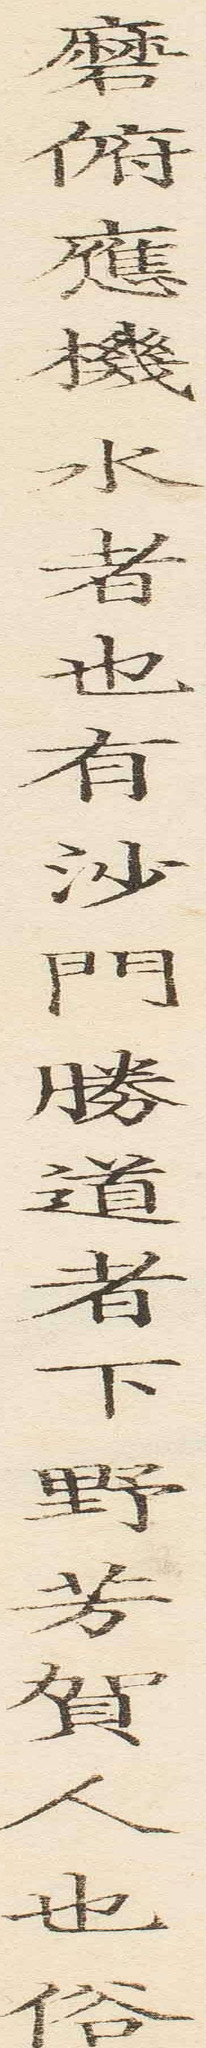磨俯應機水者也有沙門勝道者下野芳賀人也俗
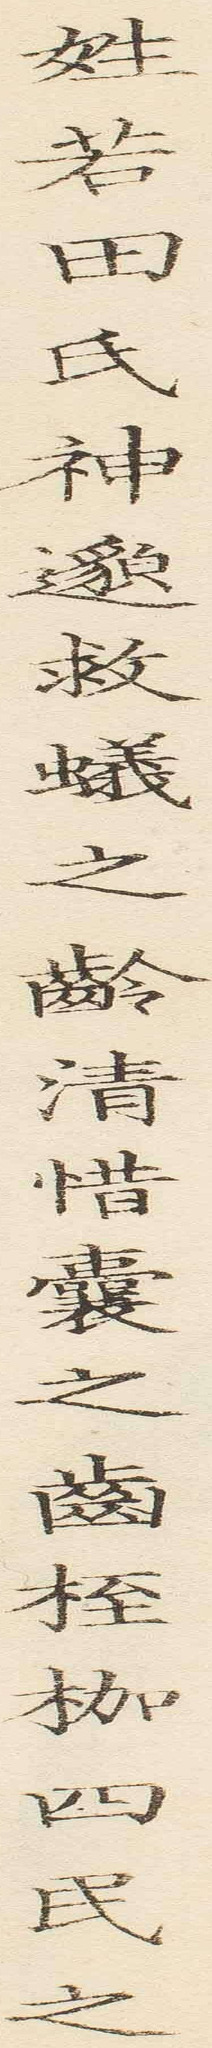姓若田氏神邈救蟻之齡清惜囊之齒桎枷四民之
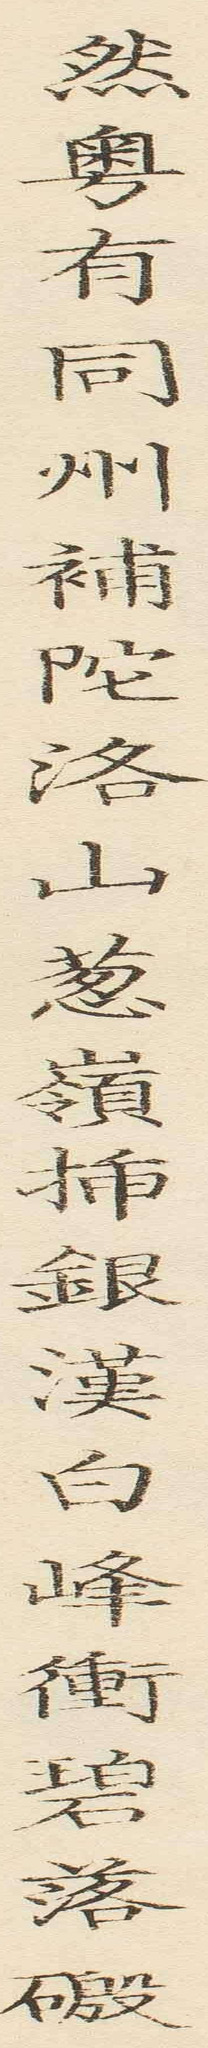然奥有同州補陀洛山葱嶺挿銀漢白峰衝碧落磤
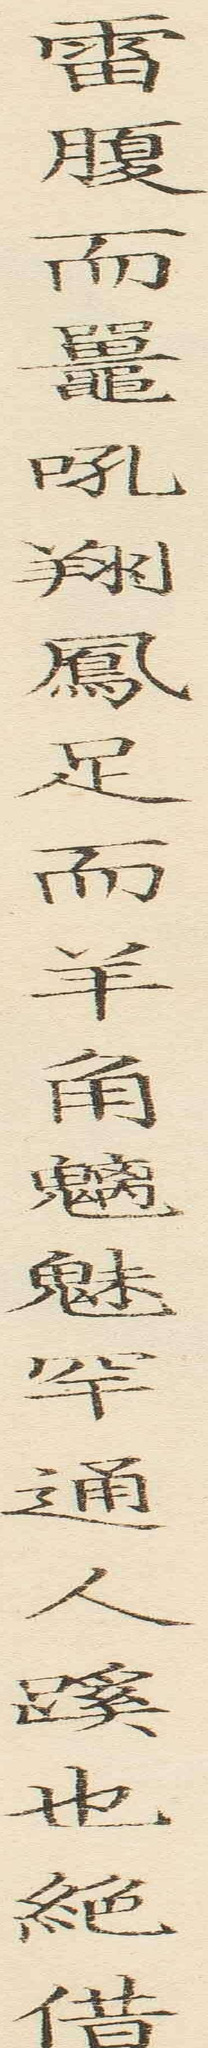雷腹而鼉吼翔鳳足而羊角魑魅罕通人蹊也絶借
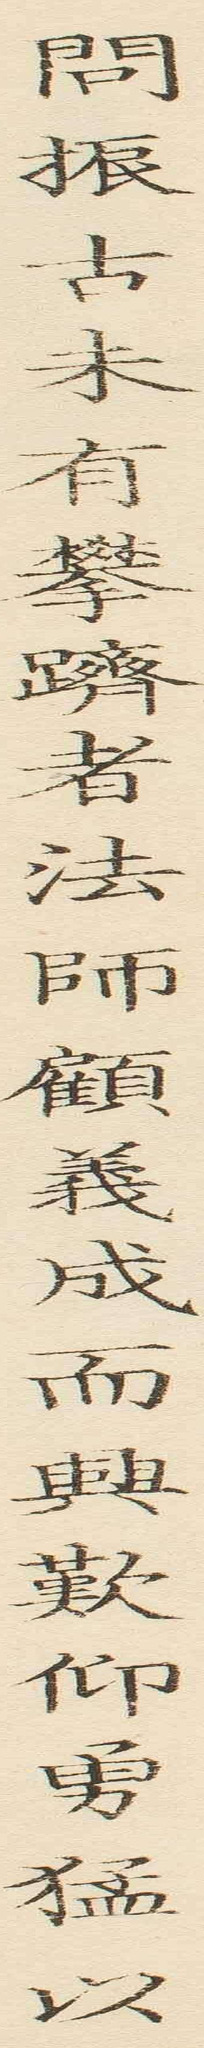問振古未有攀躋者法師顧義成而興歎仰勇猛以
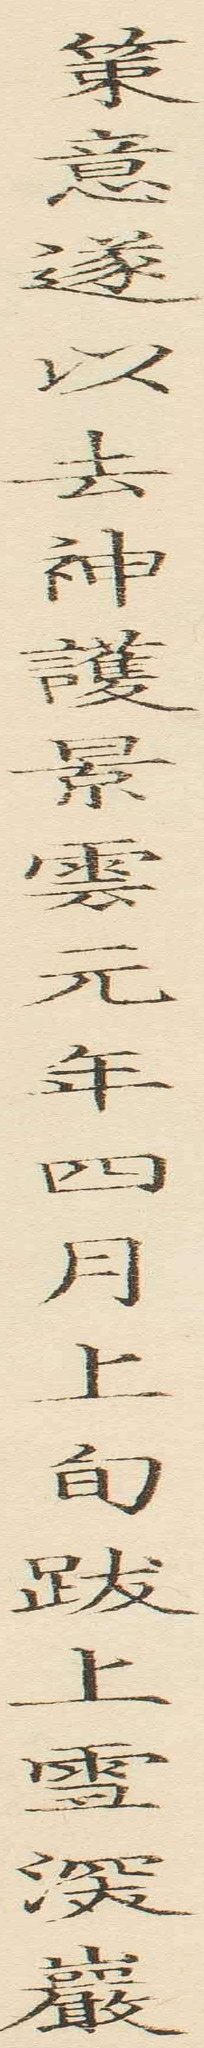䇿意遂以去神護景雲元年四月上旬跋上雪㴱巖
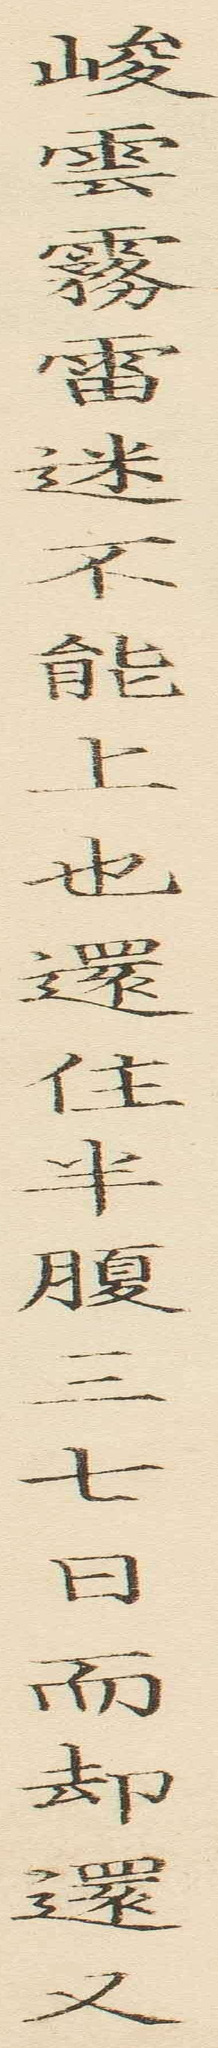峻雲霧雷迷不能上也還住半腹三七日而却還又
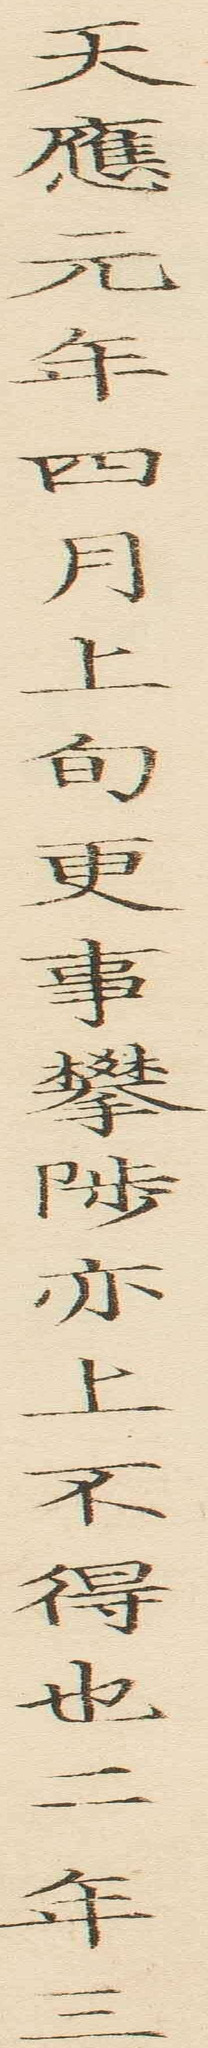天應元年四月上旬更事攀陟亦上不得也二年三
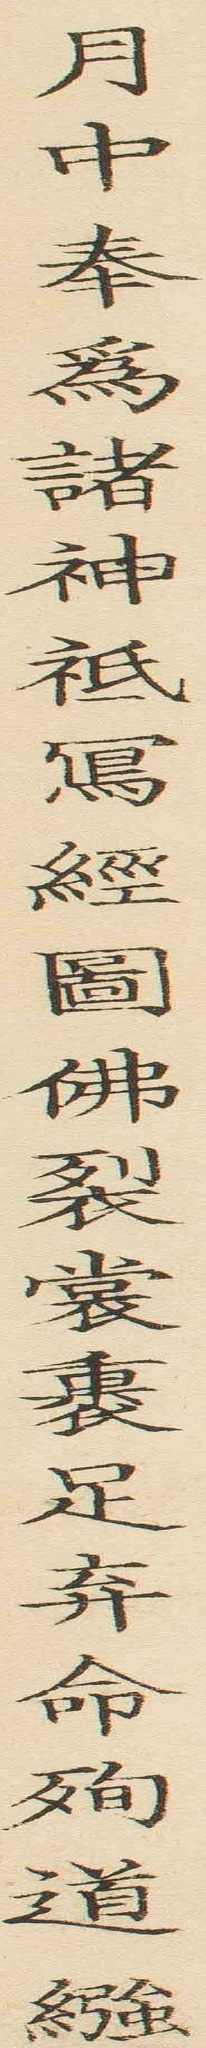月中奉爲諸神祗冩經圖佛裂裳裹足弃命殉道繈

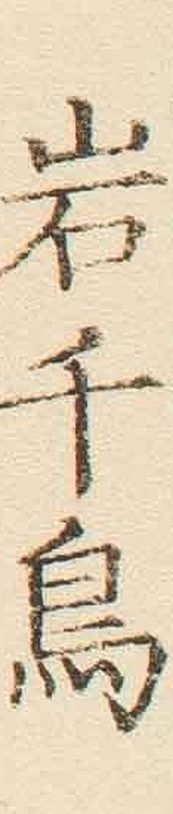岩千鳥
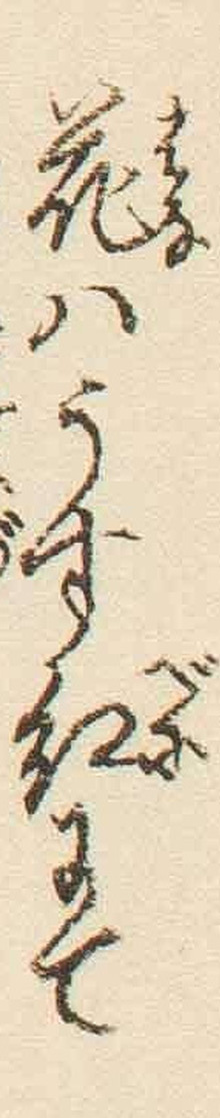花はうす紅にて
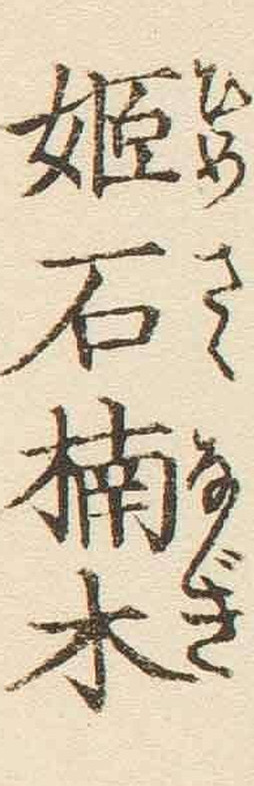姫石楠花
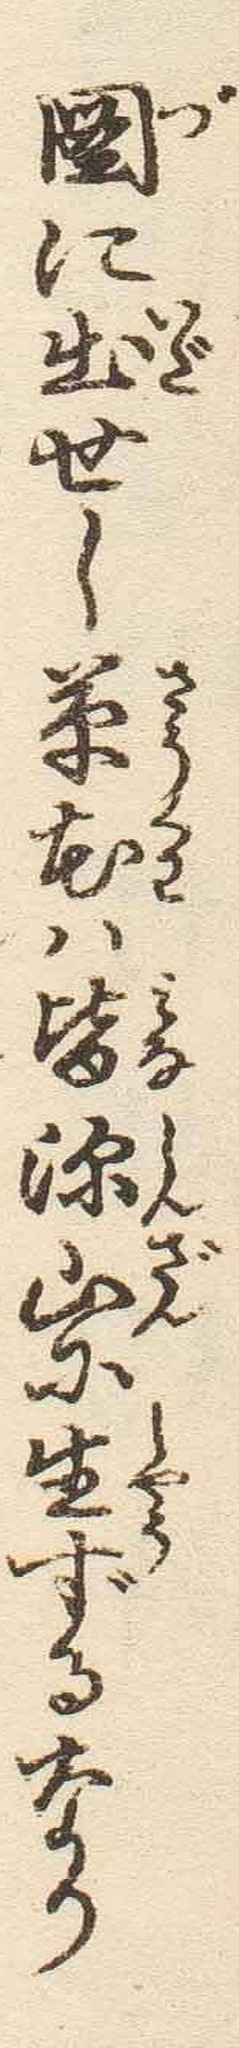圖に出せし草花は皆深山に生ずるなり
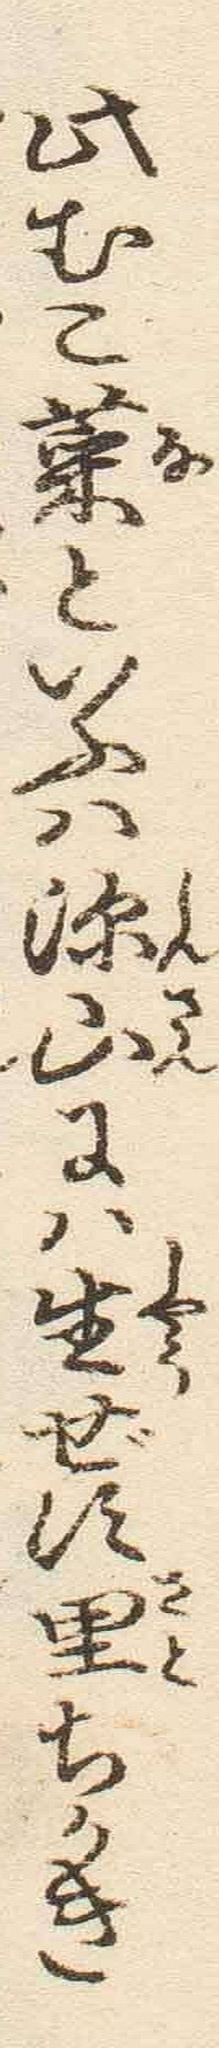此むこ菜といふは深山に生ぜす里ちかき
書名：日光山志
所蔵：東京学芸大学附属図書館 国文学研究資料館
